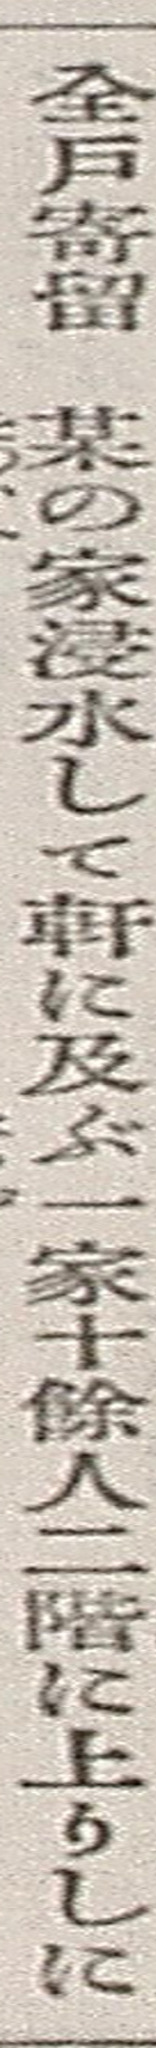全戸寄留某の家浸水して軒に及ぶ一家十餘人二階に上りしに
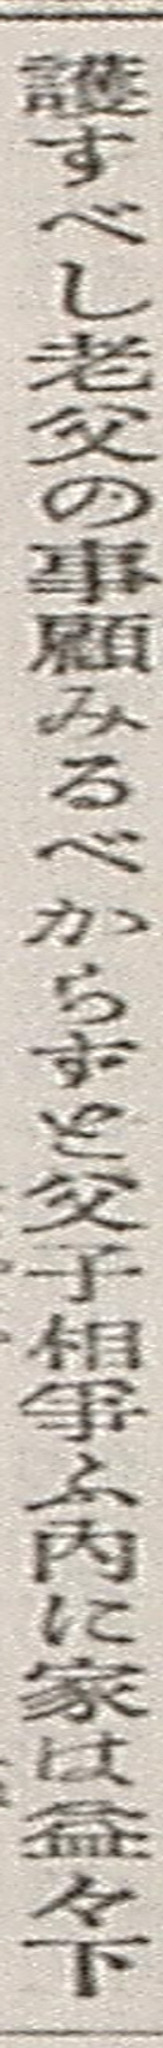護すべし老父の事顧みるべからずと父子相争ふ内に家は益々下
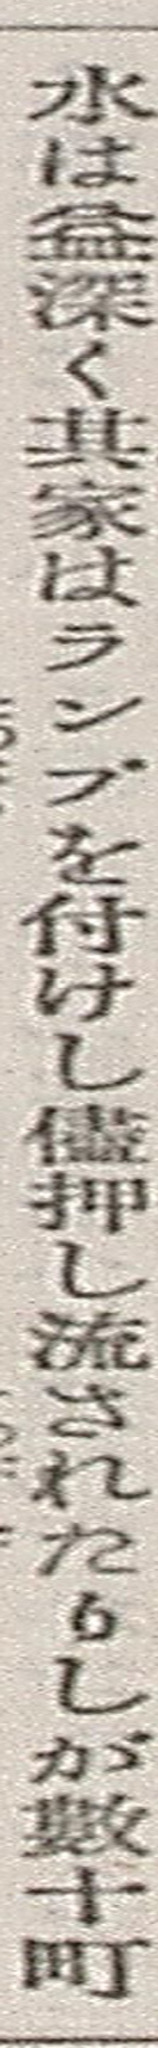水は益深く其家はランプを付けし儘押し流されたりしが数十町
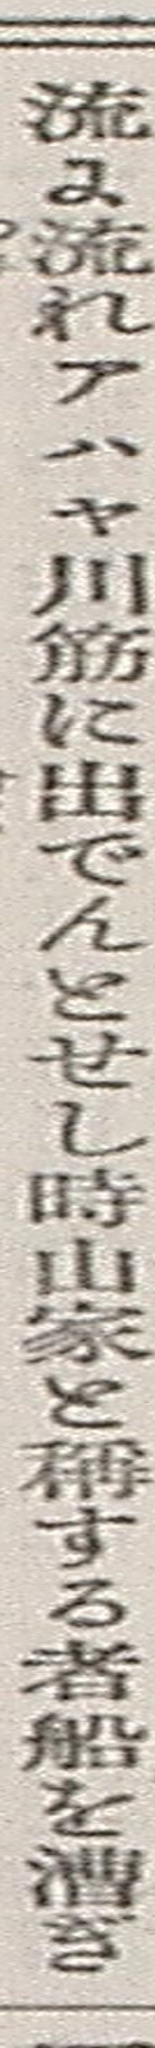流に流れアハヤ川筋に出でんとせし時山家と称する者舟を漕ぎ
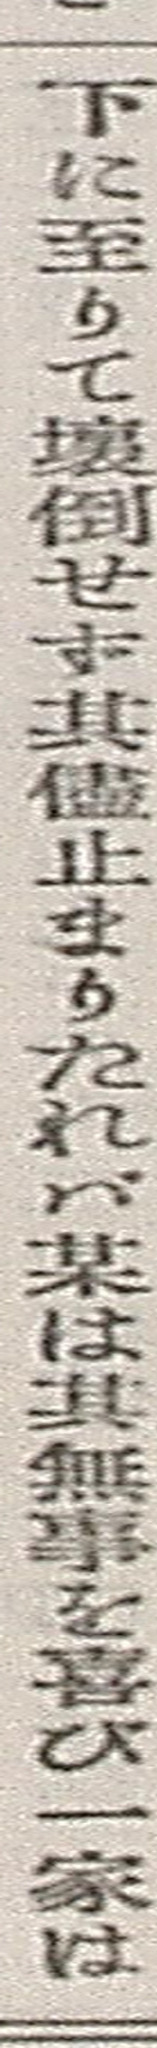下に至りて壊倒せず其儘止まりたれば某は其無事を喜び一家は
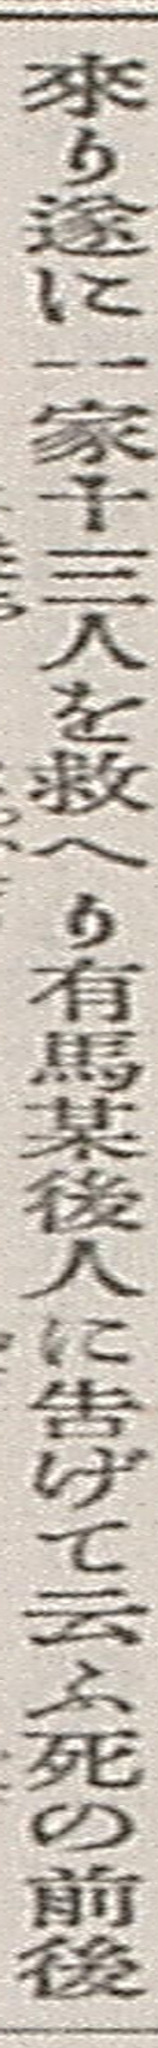来り遂に一家十三人を救へり有馬某後人に告げて言ふ死の前後
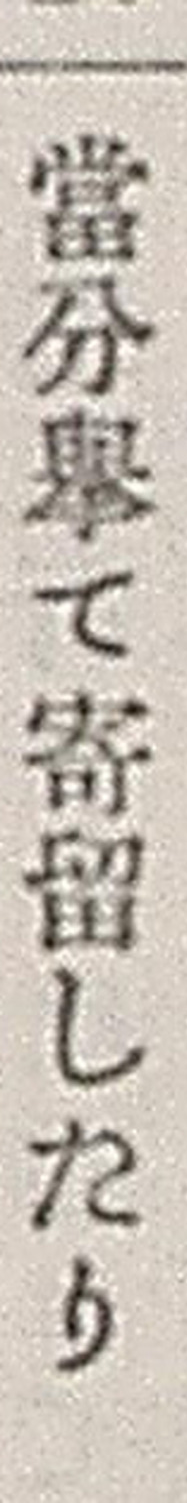当分挙て寄留したり
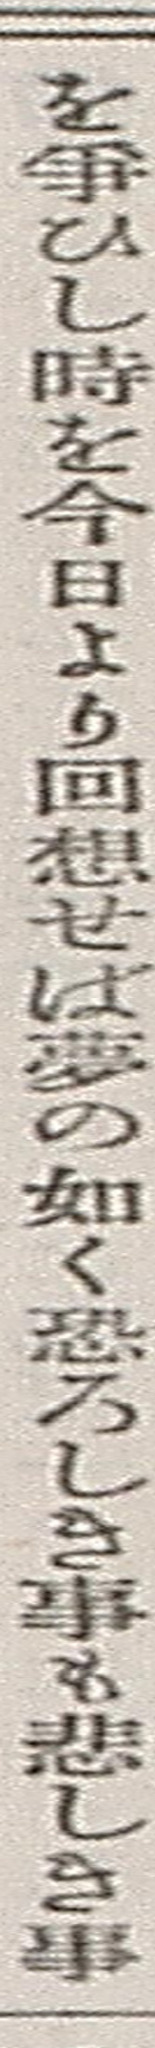を争ひし時を今日より回想せば夢の如く恐ろしき事も悲しき事
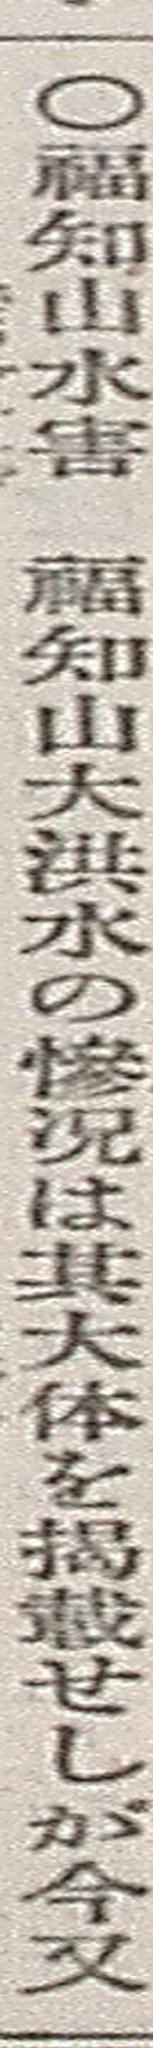◯福知山水害福知山大洪水の惨況は其大体を掲載せしが今又
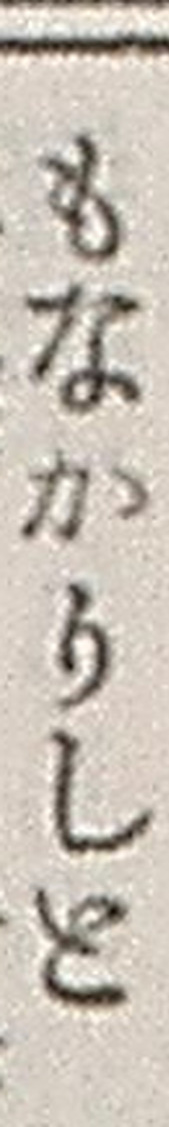もなかりしと
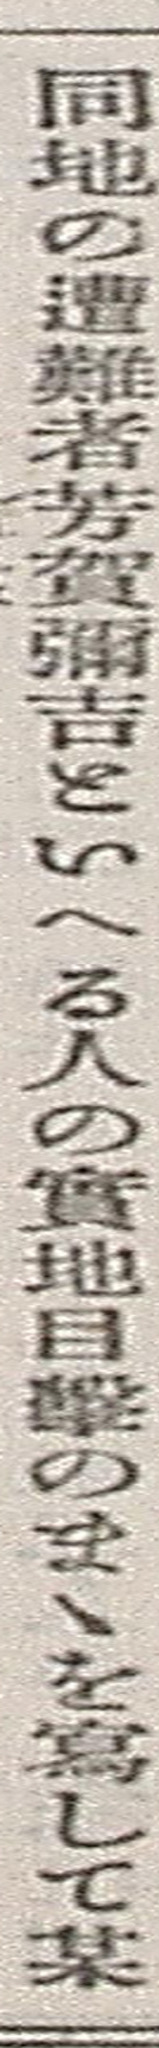同地の遭難者芳賀弥吉といへる人の実地目撃のまゝを写して某
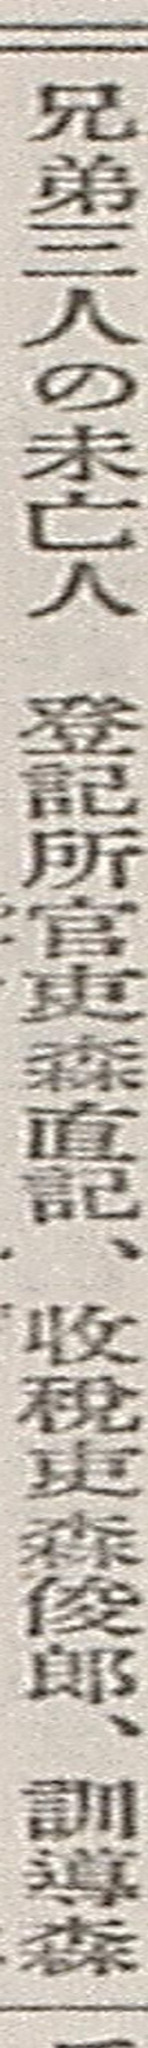兄弟三人の未亡人登記所官吏森直紀、収税吏森俊郎、訓導森
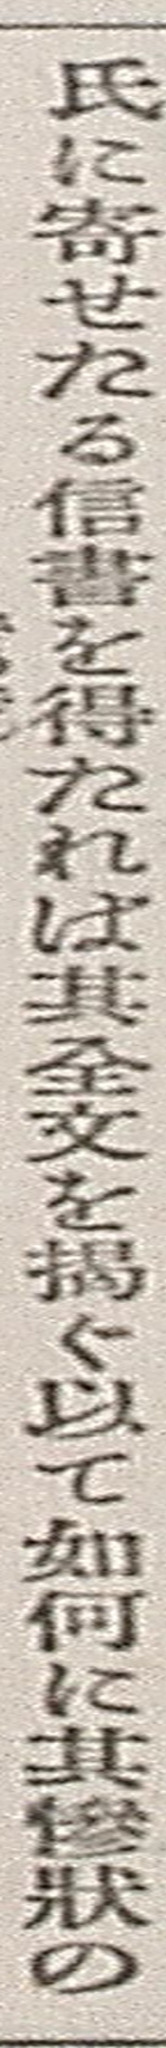氏に寄せたる信書を得たれば其全文を掲ぐ以て如何に其惨状の
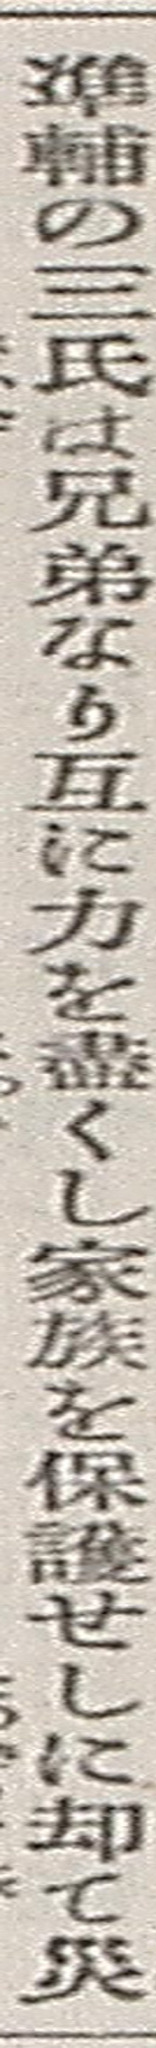準輔の三氏は兄弟なり互に力を盡くし家族を保護せしに却て災
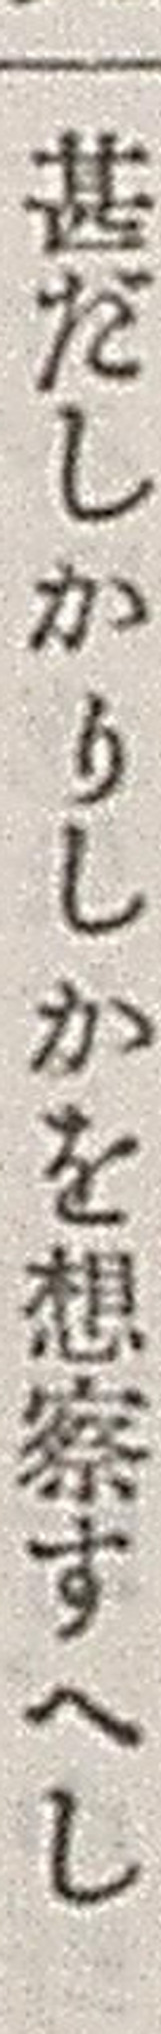甚だしかりしかを想察すべし
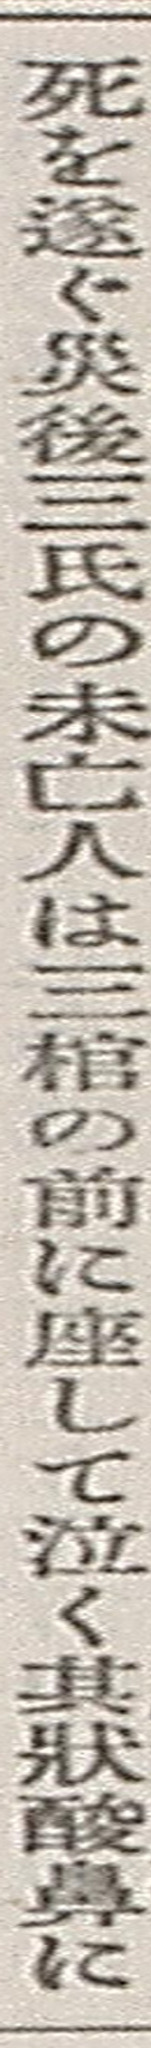死を遂ぐ災後三氏の未亡人は三棺の前に座して泣く其状酸鼻に
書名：風俗畫報臨時増刊第百二十六號　洪水被害録（中）
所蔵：東京大学地震研究所図書室 Earthquake Research Institute Library, The University of Tokyo, JAPAN
